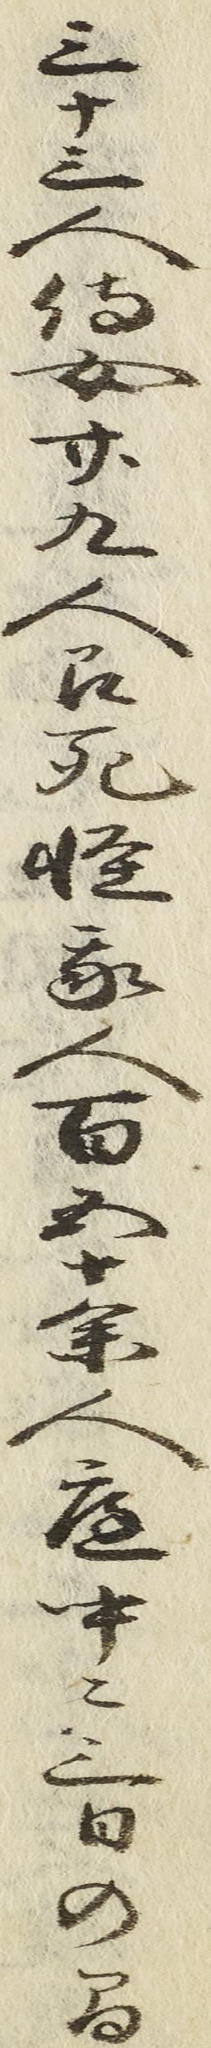三十三人侍女廿九人即死怪我人百五十余人庭中ニ三日の間
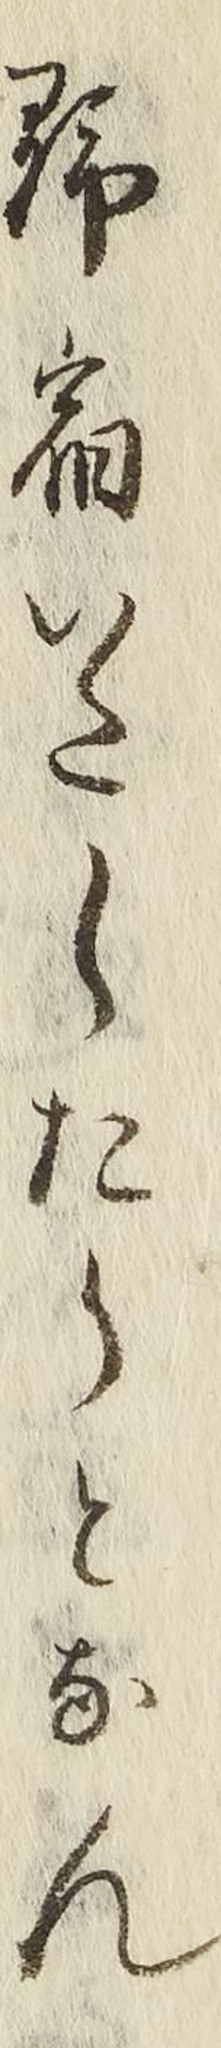野宿いたしたりとなん
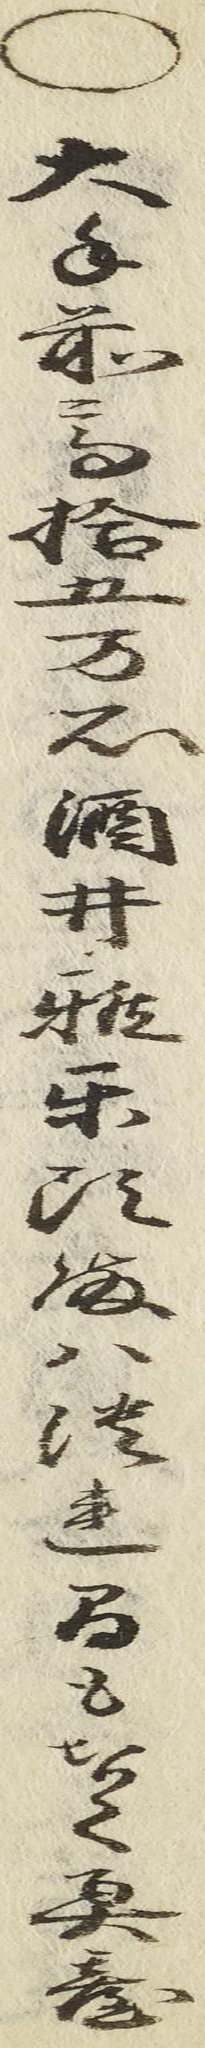○大手前高拾五万石酒井雅楽頭殿は潰れ間もなく奥台
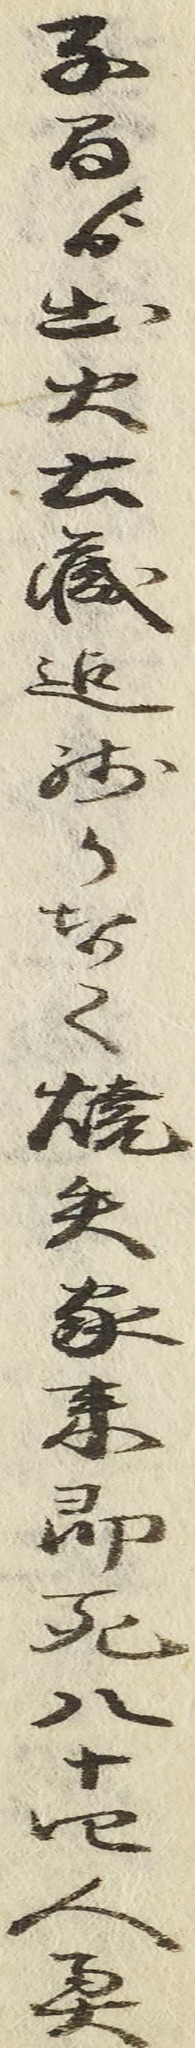子間ゟ出火土蔵迄残りなく焼失家来即死八十四人奥
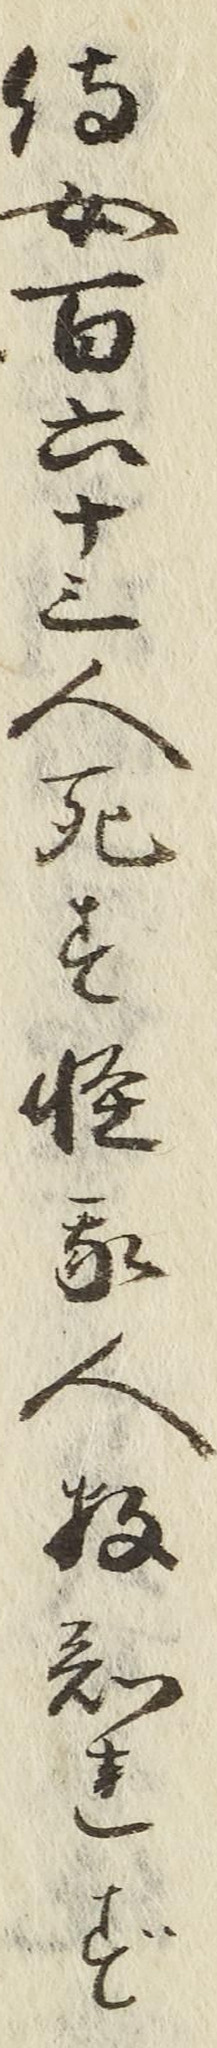侍女百六十三人死す怪我人数知れず
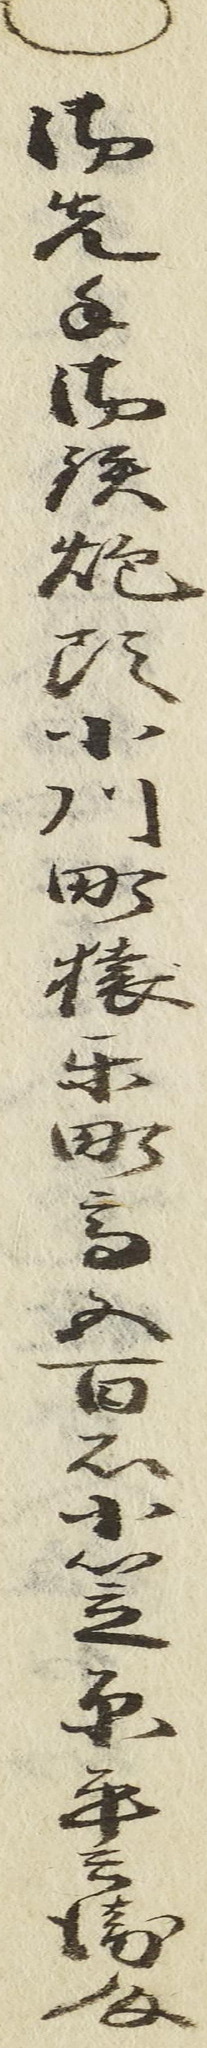○御先手御鉄炮頭小川町猿楽町高五百石小笠原平兵衛殿
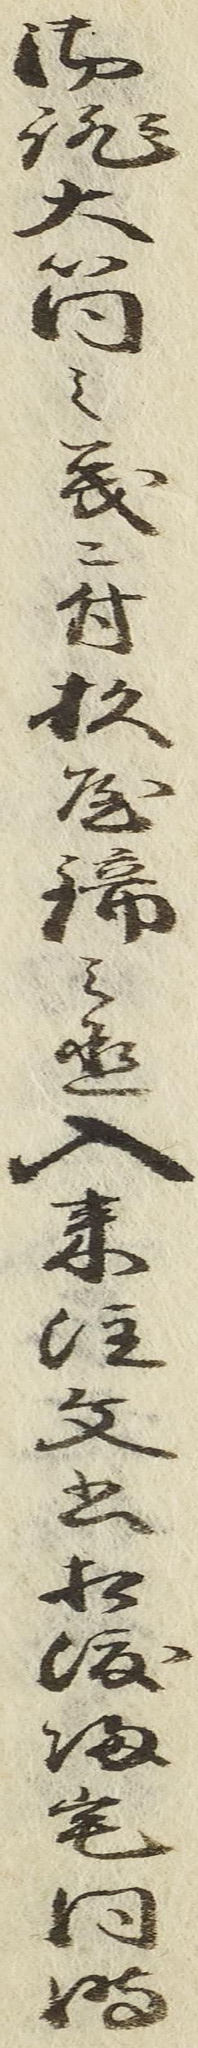御誂大筒之義ニ付杉屋鍗之丞入来注文書相渡帰宅同時
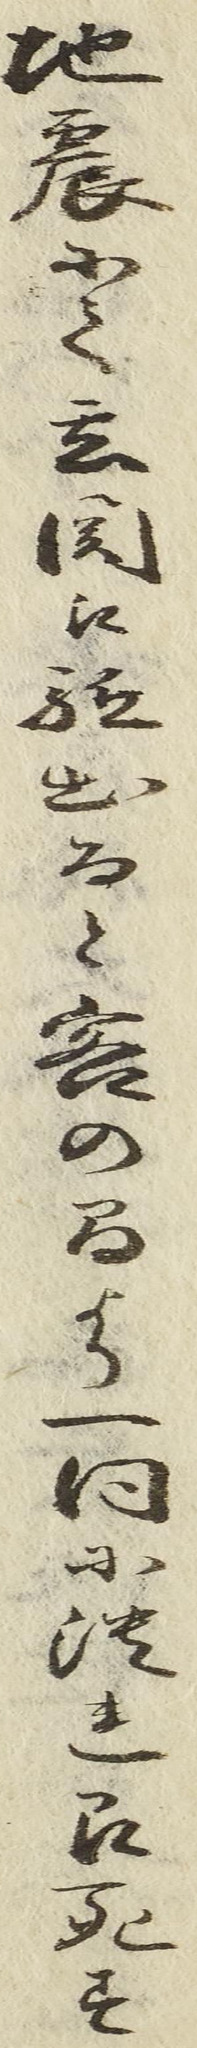地震にて玄関江駈出ると客の間より一同に潰れ即死す
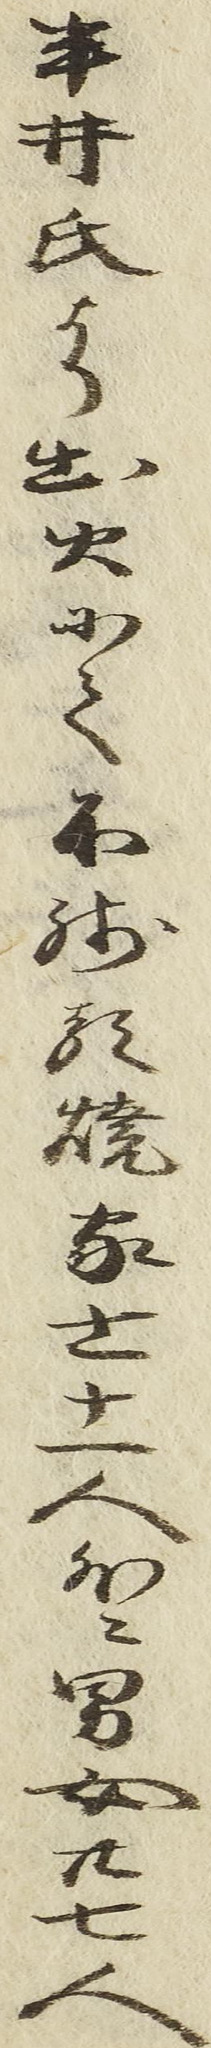半井氏より出火にて不残類焼家士十一人外ニ男女廿七人

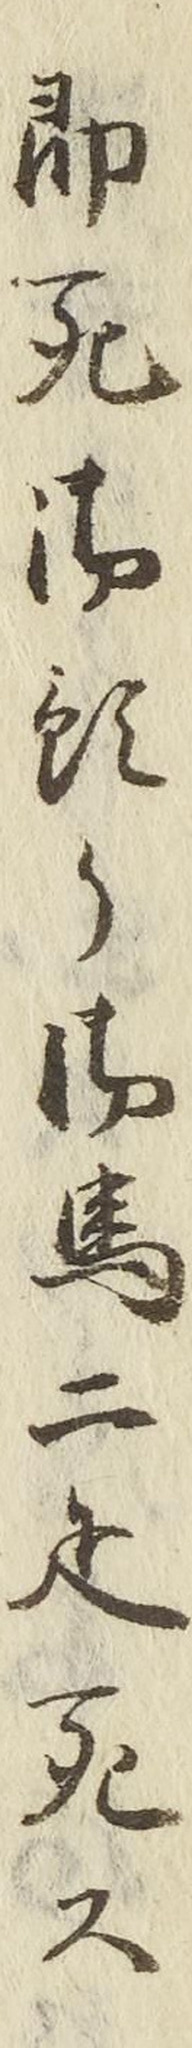即死御預り御馬二疋死ス
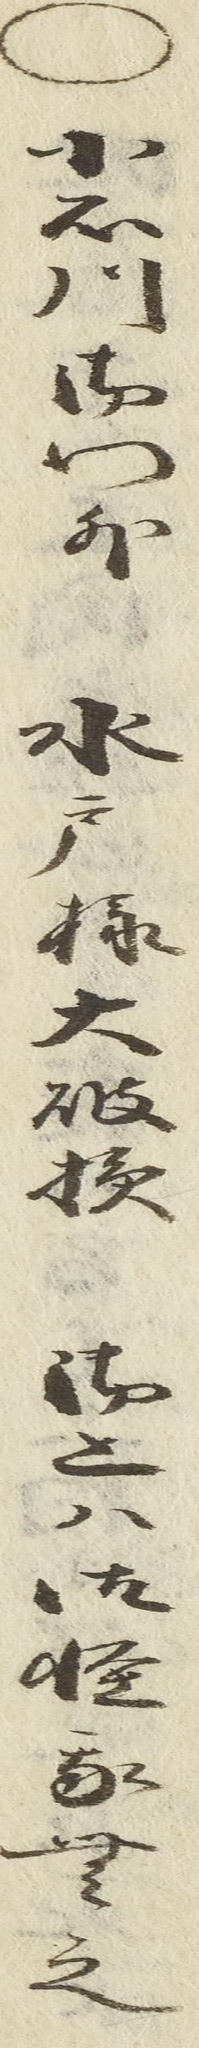○小石川御門外水戸様大破損御上は御怪我無之
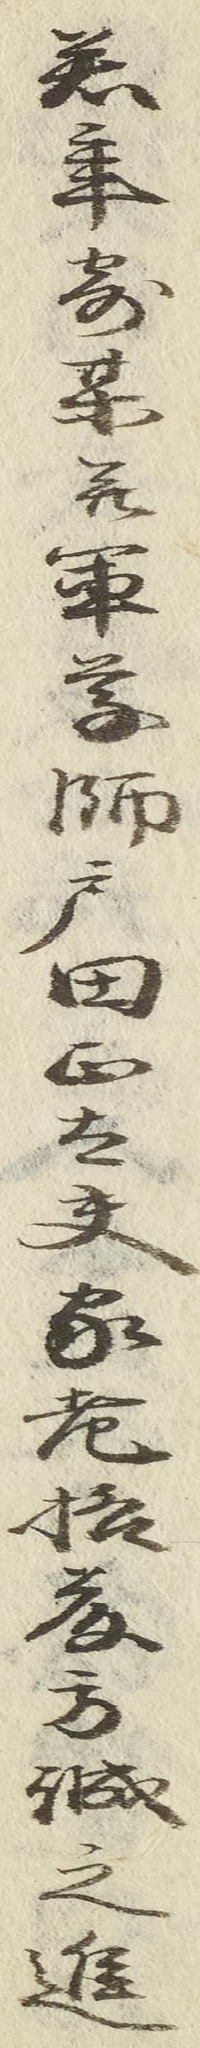若年寄某幷軍学師戸田正太夫家老格藤方誠之進
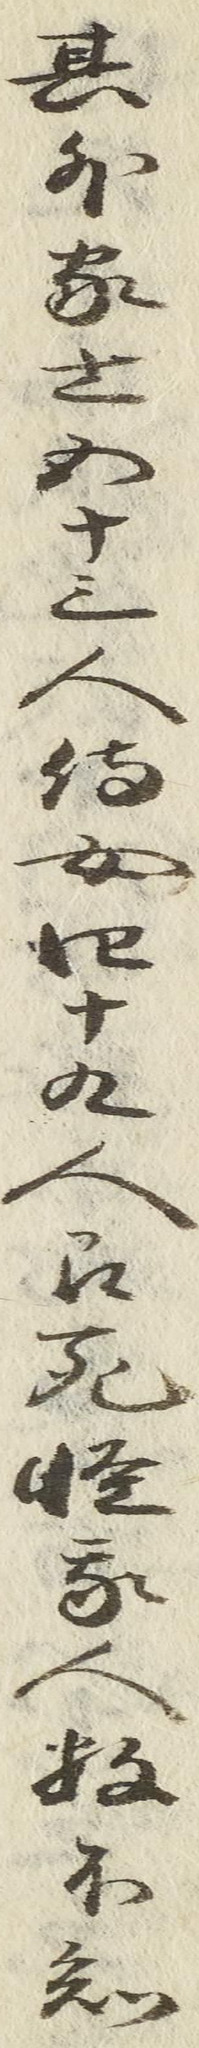其外家士五十三人侍女四十九人即死怪我人数不知
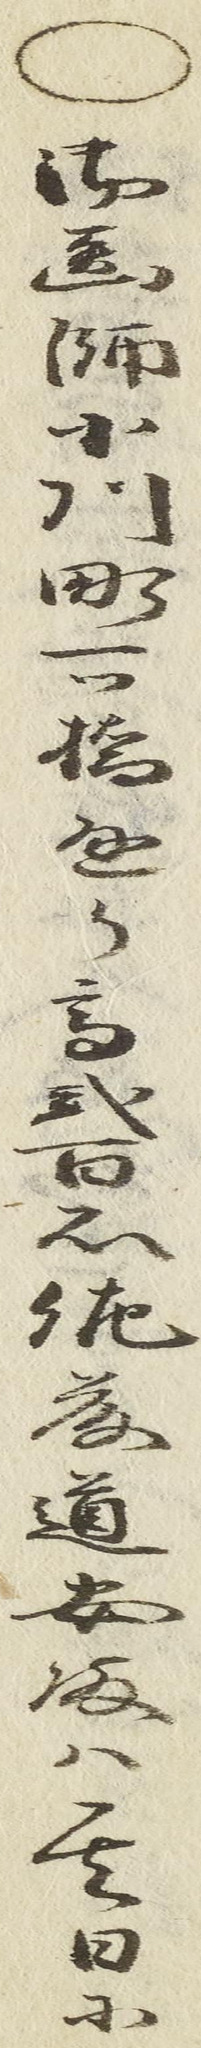○御医師小川町一ツ橋通り高弐百石佐藤道安殿は其日に
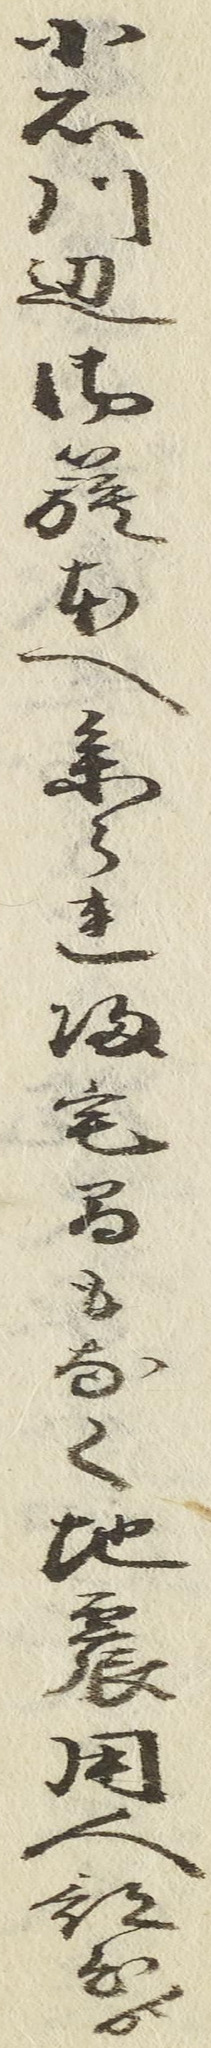小石川辺御籏本へ参られ帰宅間もなく地震用人部屋ゟ
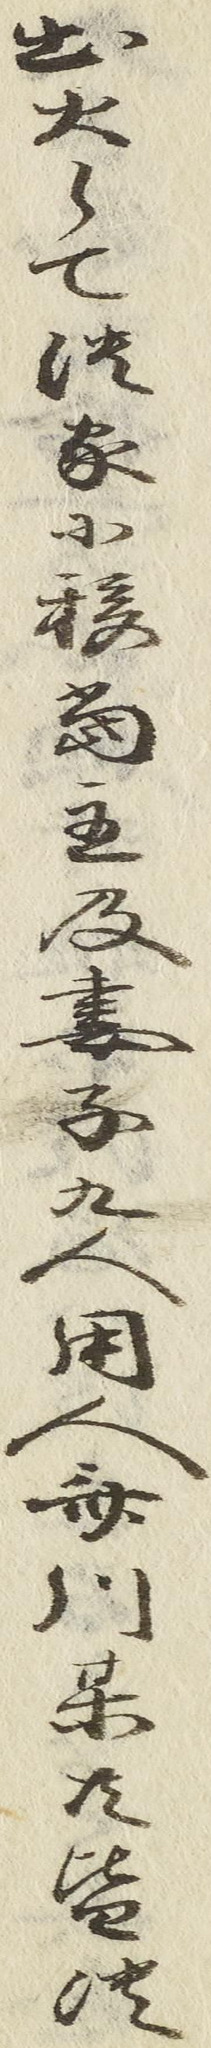出火して潰家に移当主及妻子九人用人斎川某共皆潰
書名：安政二年震災記事　完
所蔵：東京大学地震研究所図書室 Earthquake Research Institute Library, The University of Tokyo, JAPAN
